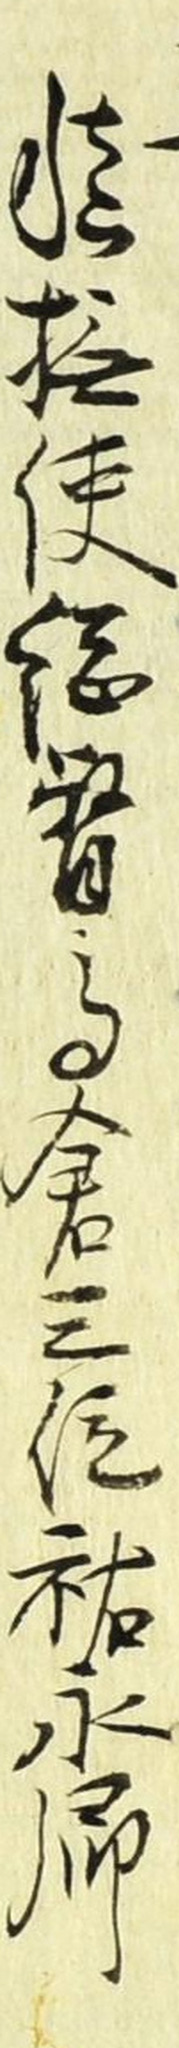慎撫使総督高倉三位祐永卿
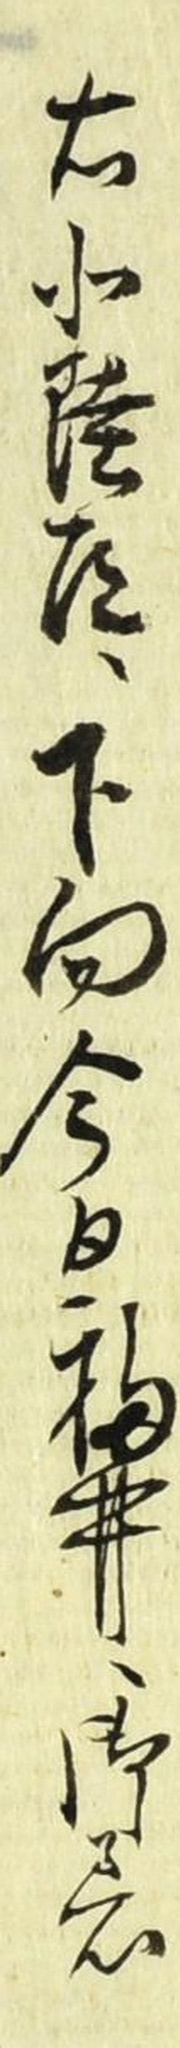右北陸道へ下向今日福井へ御着
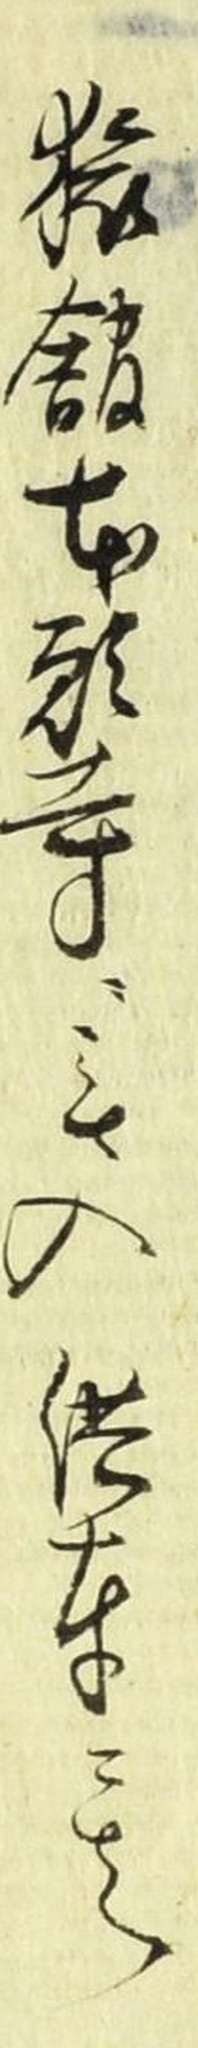旅舘本願寺に被入供奉には
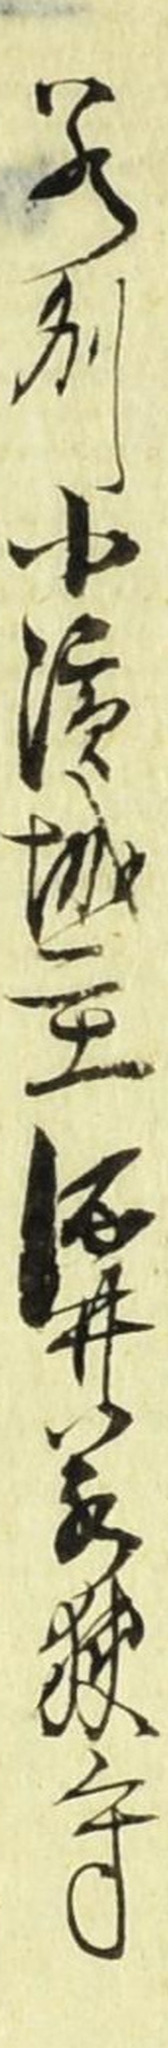若州小浜城主酒井若狭守
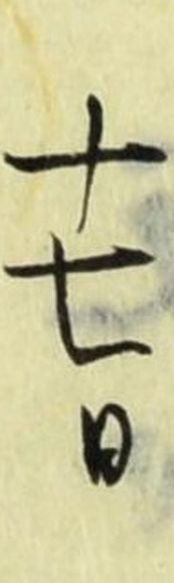十七日
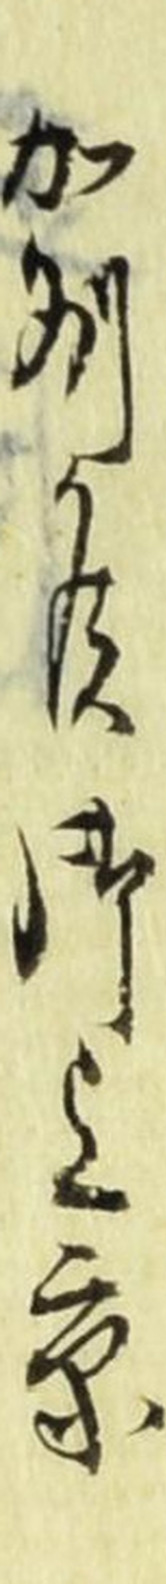加州侯上京
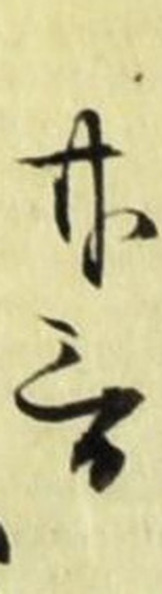廿三日
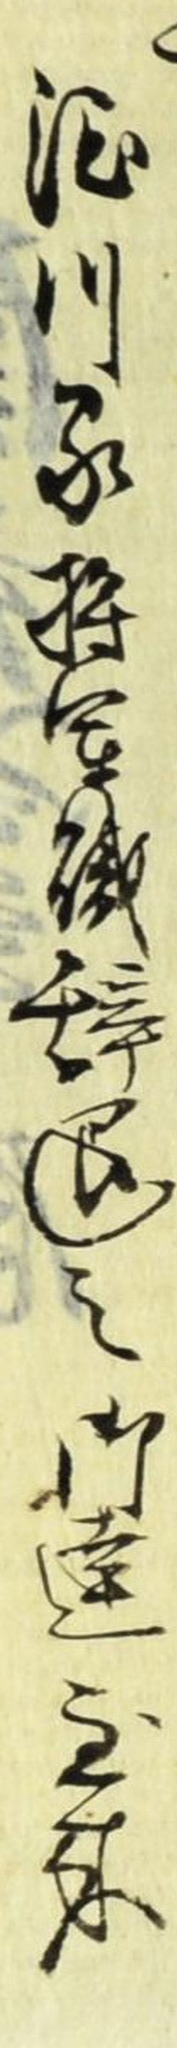徳川家将軍職辞退之御達到来
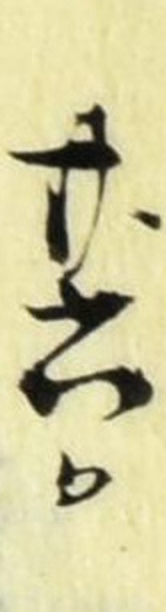廿三日
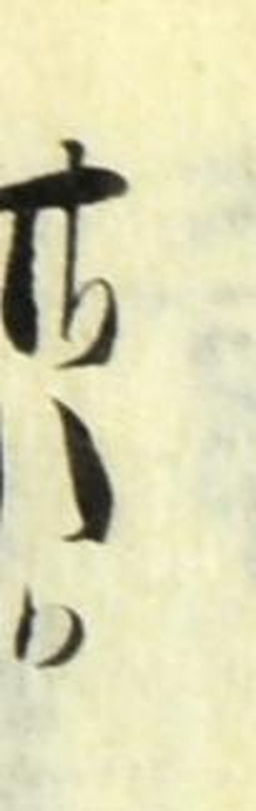廿三日

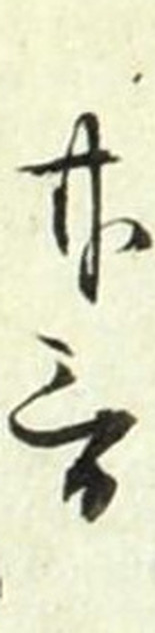廿六日
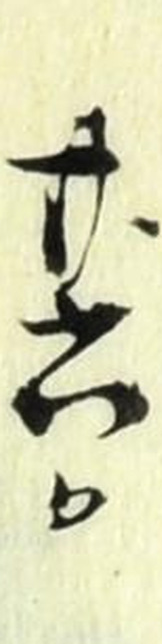廿六日
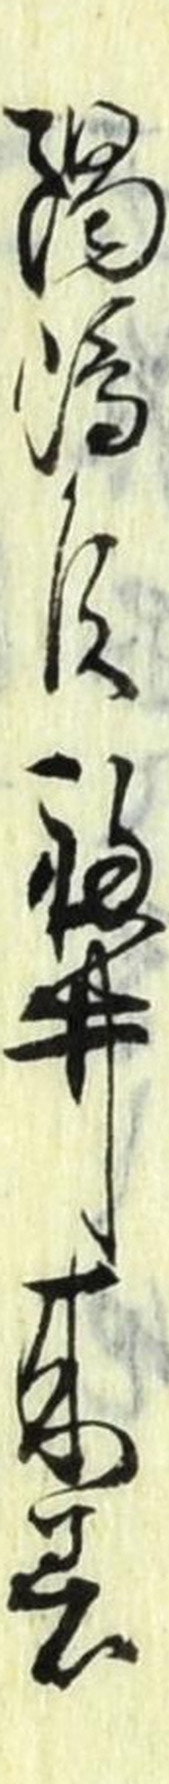鍋島侯福井来着
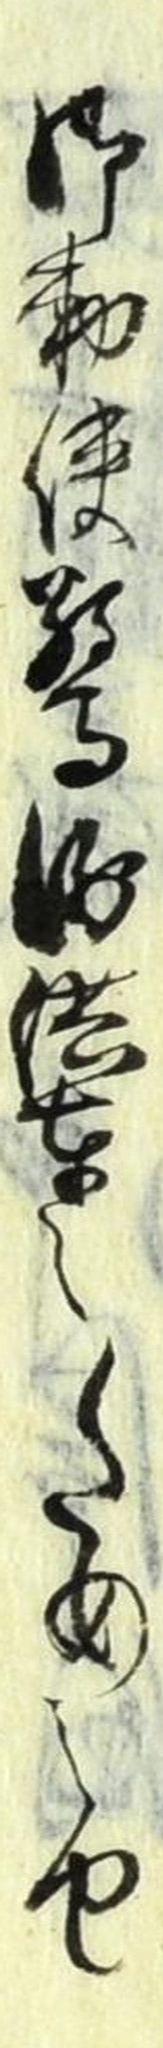御勅使警衛御供奉之ため之由
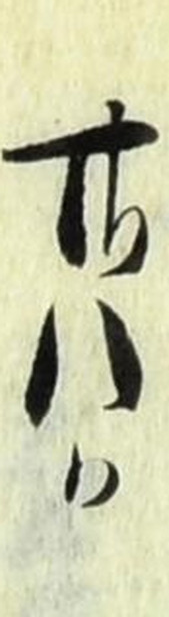廿八日
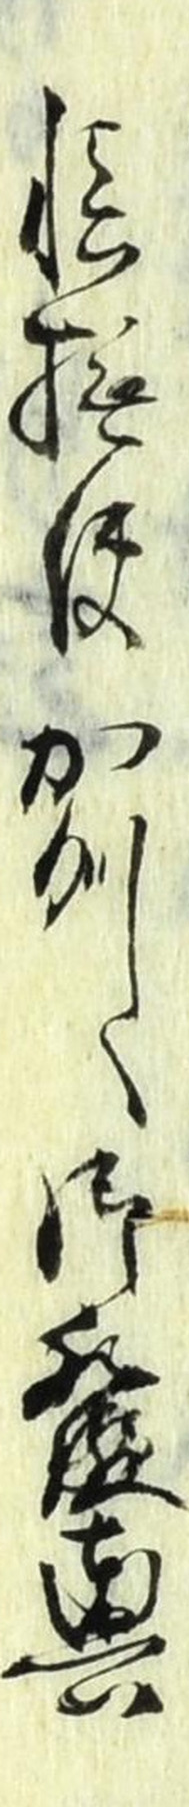慎撫使加州へ御発輿
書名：（日記）
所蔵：福井県文書館 Fukui Prefectural Archives
